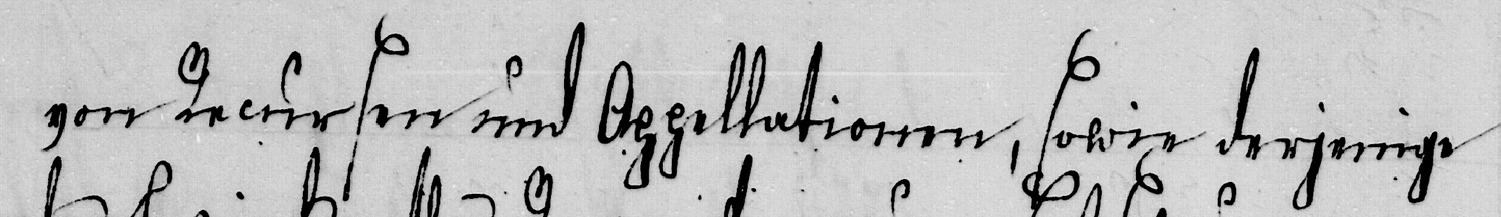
von Recursen und Appellationen, sowie derjenige
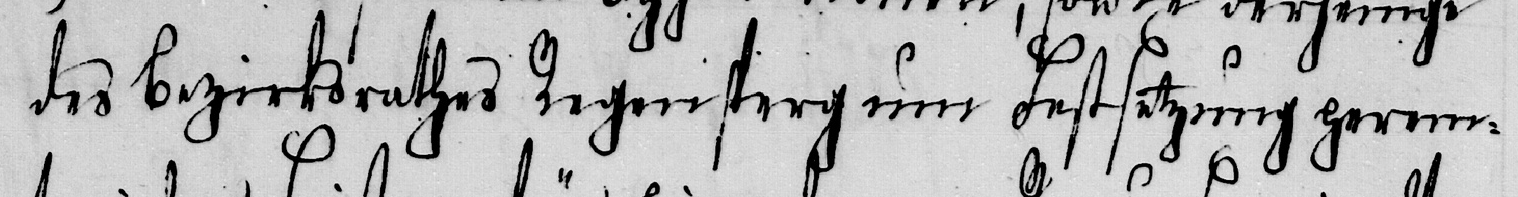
des Bezirksrathes Regensperg um Festsetzung perem¬
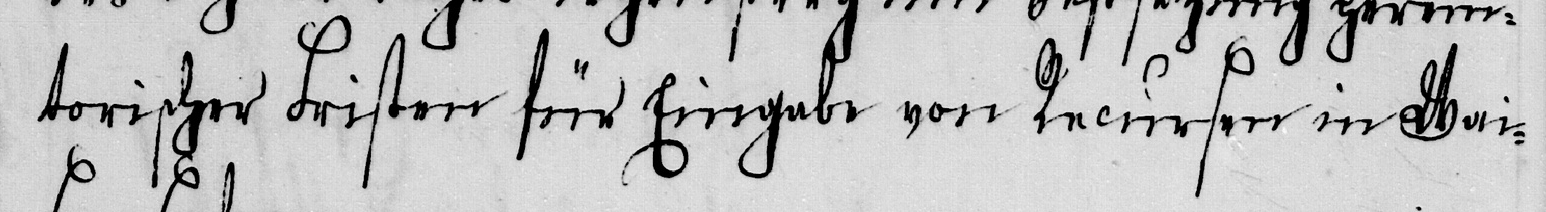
torischer Fristen für Eingabe von Recursen in Wai¬
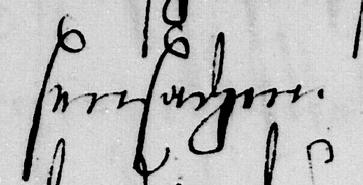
sensachen.
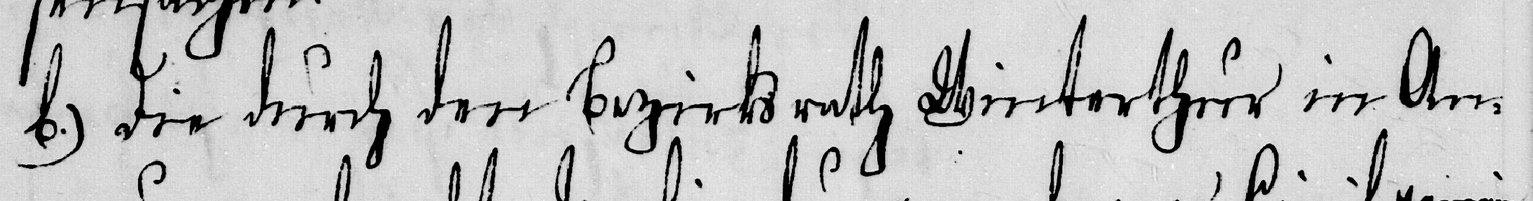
b.) Die durch den Bezirksrath Winterthur in An¬
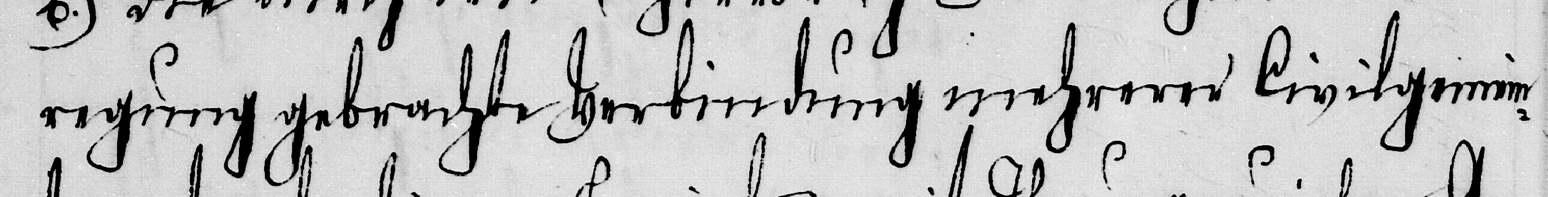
regung gebrachte Verbindung mehrerer Civilgemei¬
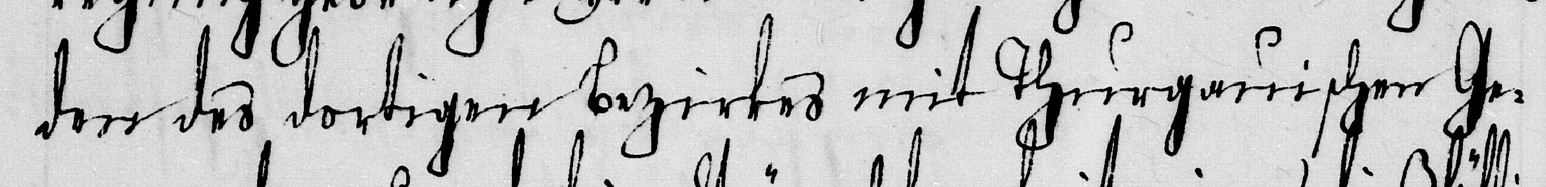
nden des dortigen Bezirks mit Thurgauischen Ge¬
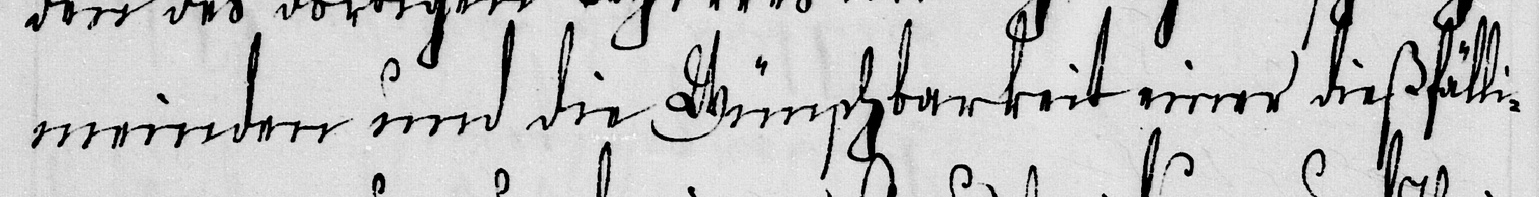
meinden und die Wünschbarkeit einer dießfälli¬
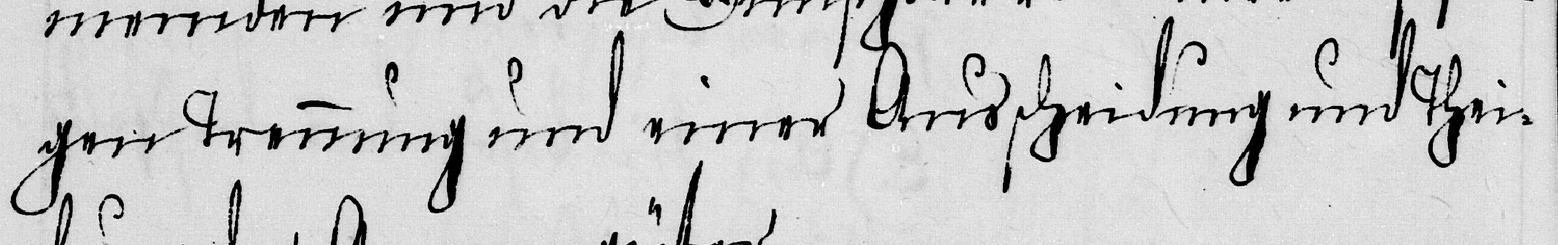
gen Trennung und einer Ausscheidung und Thei¬
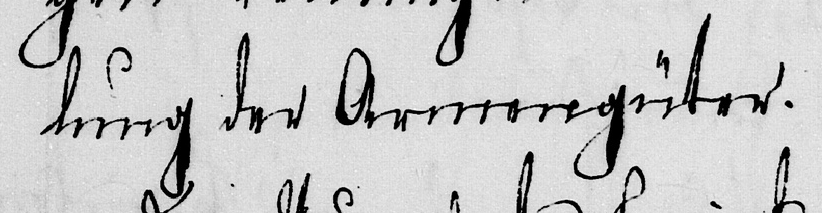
lung der Armengüter.
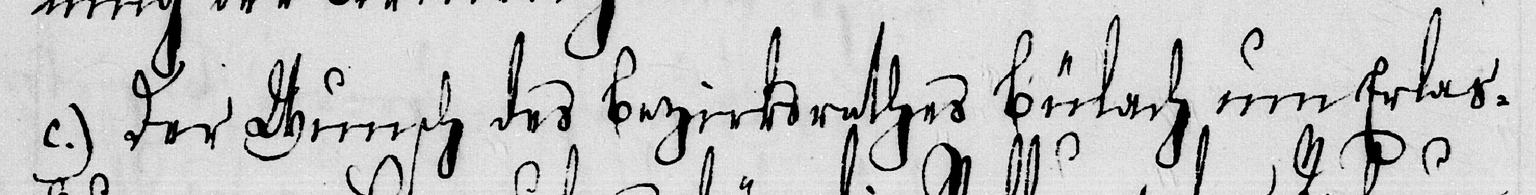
c.) Der Wunsch des Bezirksrathes Bülach um Erlaß¬
